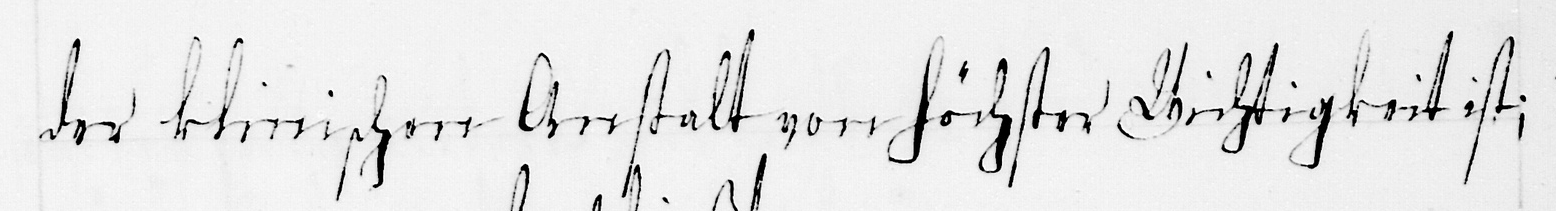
der klinischen Anstalt von höchster Wichtigkeit ist;
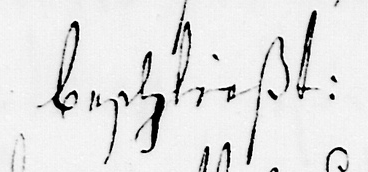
beschließt:
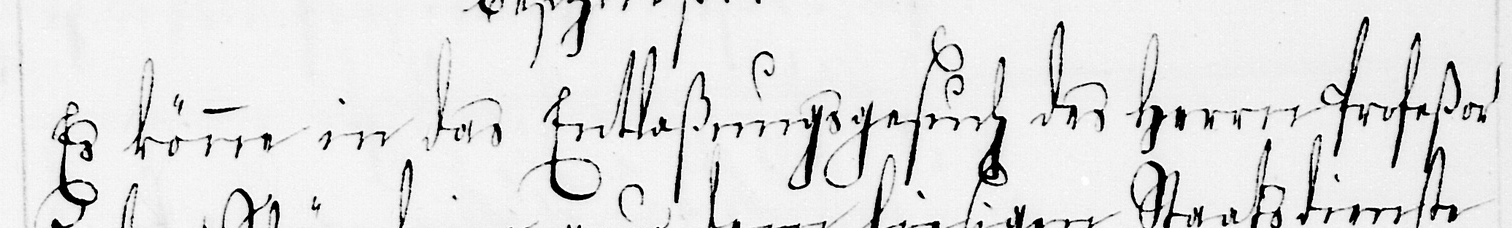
Es könne in das Entlaßungsgesuch des Herrn Profeßor
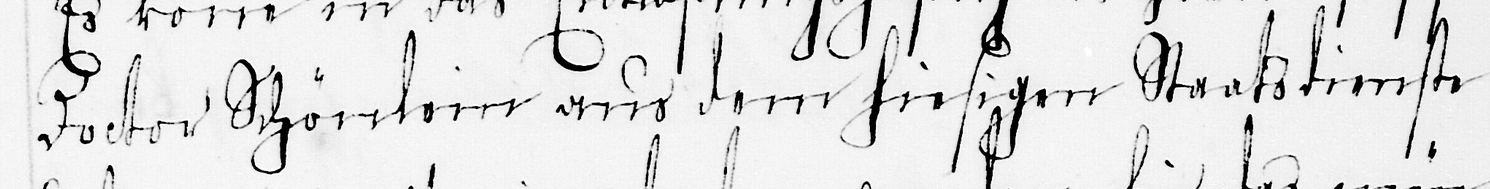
Doctor Schönlein aus dem hiesigen Staatsdienste
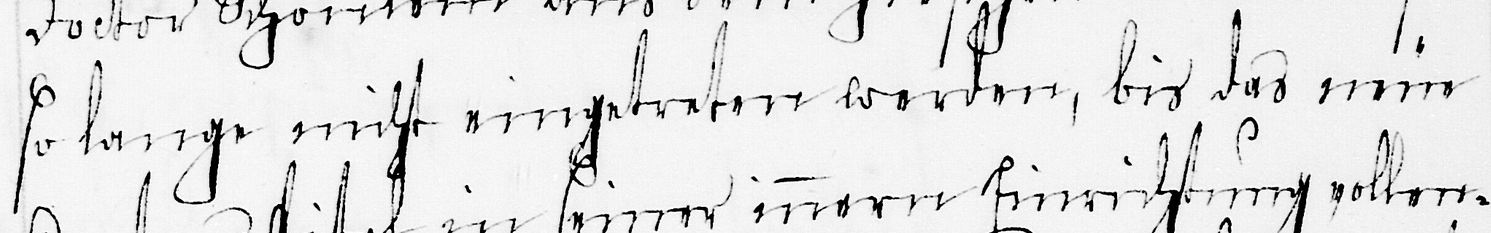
so lange nicht eingetreten werden, bis das neue
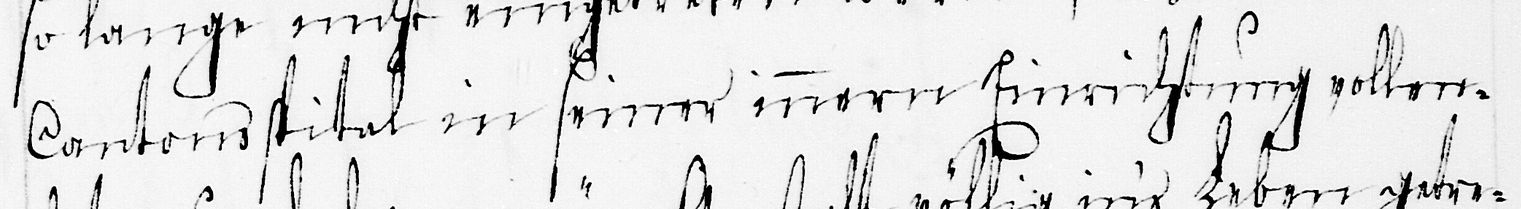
Cantonsspital in seiner innern Einrichtung vollen¬
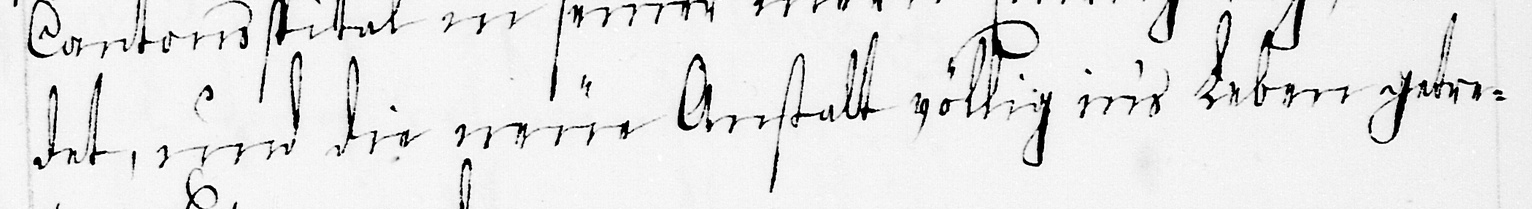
det, und die neue Anstalt völlig in’s Leben getre¬
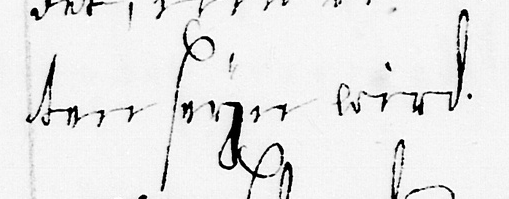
ten seyn wird.
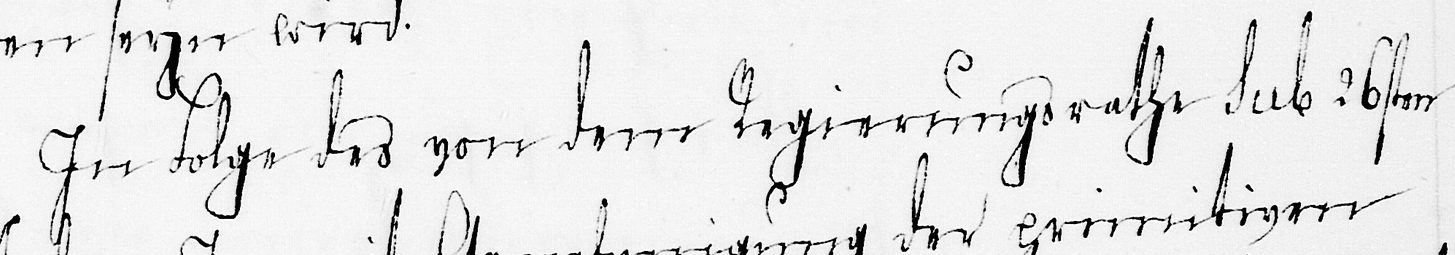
In Folge des von dem Regierungsrathe sub 26sten
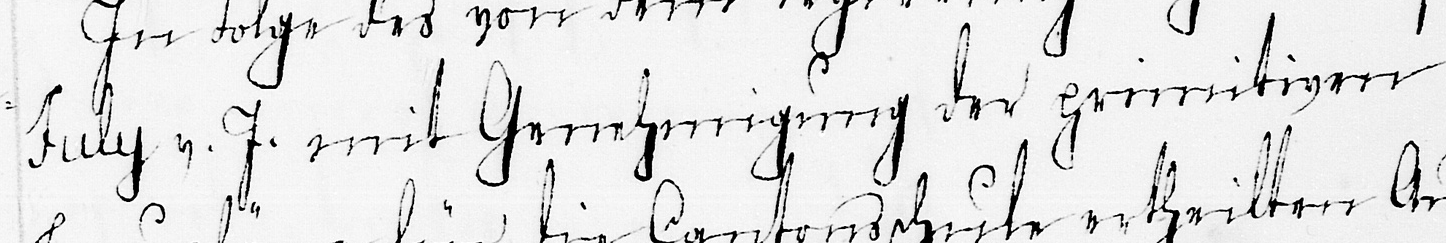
July v. J. mit Genehmigung der primitiven
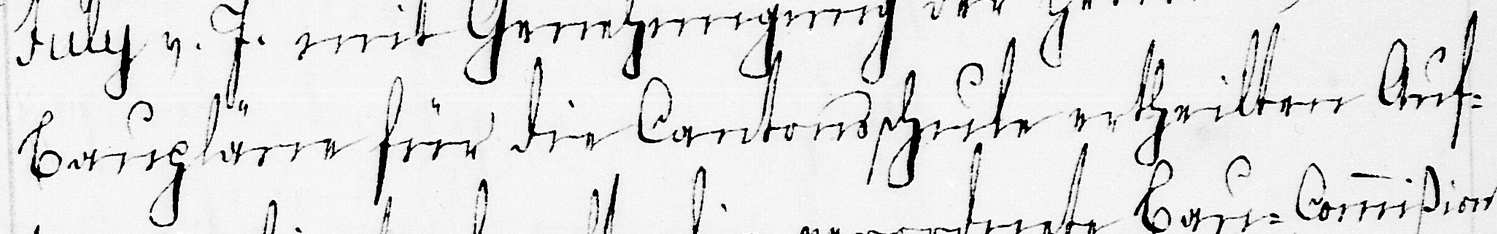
Baupläne für die Cantonsschule ertheilten Auf¬
